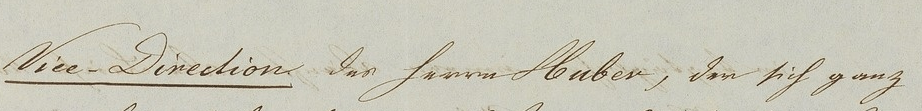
Vice-Direction des Herrn Huber, der sich ganz
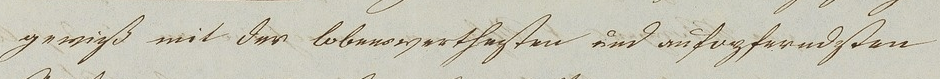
gewiß mit der lobenswerthesten und aufopferndsten
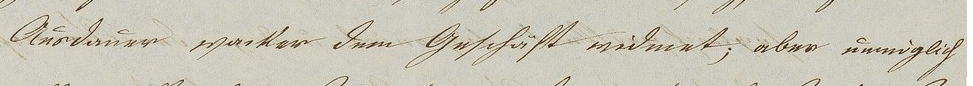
Ausdauer wacker dem Geschäft widmet; aber unmöglich
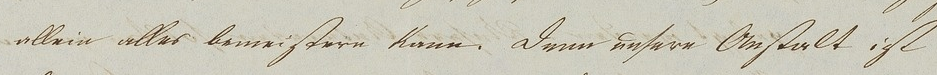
allein alles bemeistern kann. Denn unsere Anstalt ist
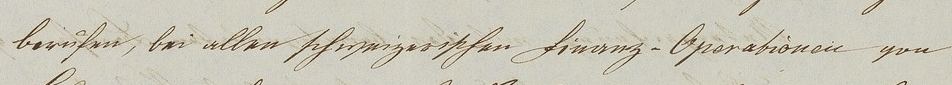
berufen, bei allen schweizerischen Finanz-Operationen von
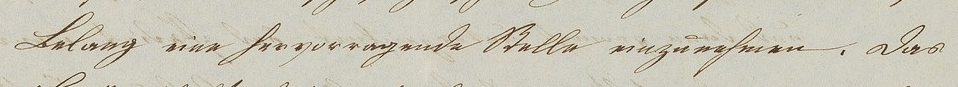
Belang eine hervorragende Stelle einzunehmen. Das
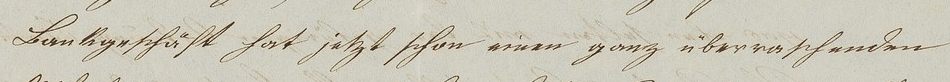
Bankgeschäft hat jetzt schon einen ganz überraschenden
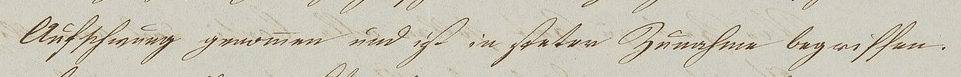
Aufschwung genommen und ist in steter Zunahme begriffen.
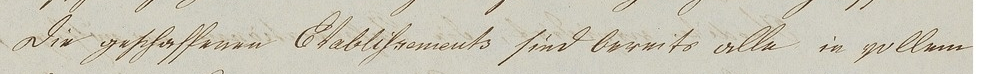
Die geschaffenen Etablissements sind bereits alle in vollem
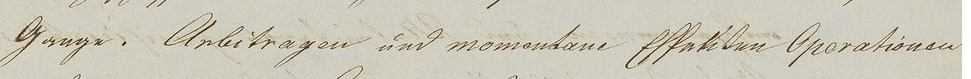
Gange. Arbitragen und momentane Effekten Operationen
